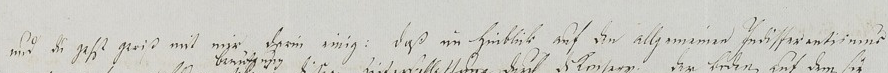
und du gehst gewiß mit mir darin einig: daß im Hinblick auf den allgemeinen Indifferentismus
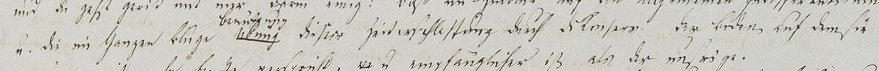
u. die im Ganzen kluge ÜbungBenützung dieser Zeiterschlaffung durch die Konserv. der Boden auf dem sie
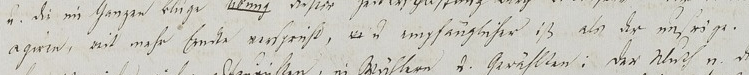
agiren, weit mehr Erndste verspricht, u. empfänglicher ist als der unsrige.
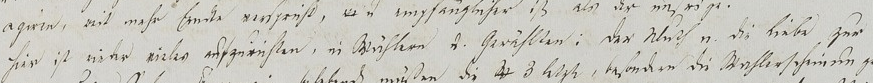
Hier ist wieder vieles aufzurichten, in Wählern u. Gewählten: der Muth u. die Liebe zur
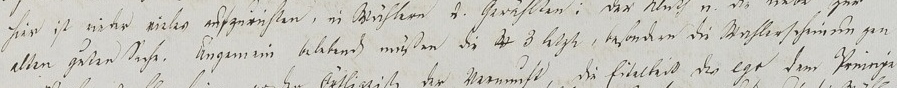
alten guten Sache. Ungemein belebend müssen die W 3 letzten, besondern die Wahlerscheinungen
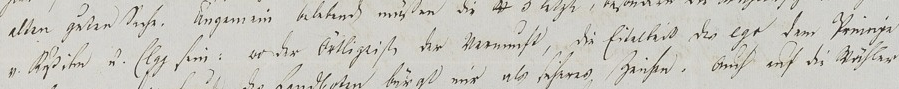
v. Rußikon u. Elgg sein: wo der Örtligeist der Vernunft, die Eitelkeit des ego dem Principe
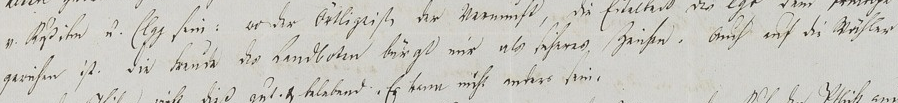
gewichen ist. Die Freude des Landboten bürgt mir als sicheres Zeichen. Auch auf die Wähler
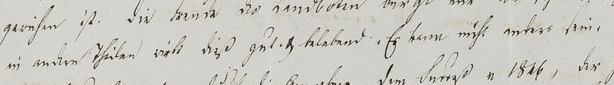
in andern Theilen wirkt dieß gut & belebend. Es kann nicht anders sein.
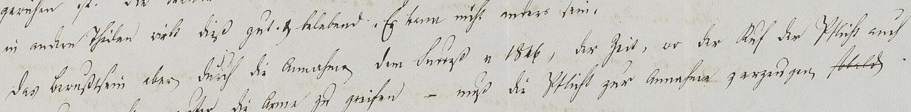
Das Bewußtsein aber, durch die Annahme dem Succeß von 1846, der Zeit, wo der Ruf der Pflicht auch
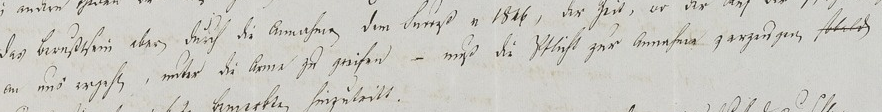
an uns ergeht, unter die Arme zu greifen – muß die Pflicht zur Annahme erzeugen sobald
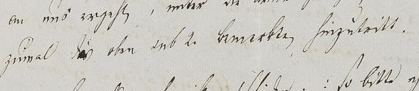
zumal das eben sub 2. Bemerkte hinzutritt.
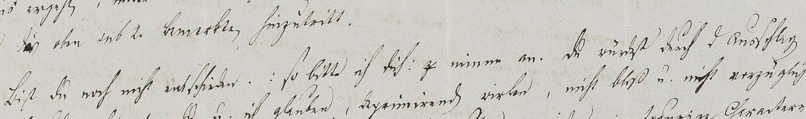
Bist Du noch nicht entschieden: so bitte ich dich nimm an. Du würdest durch d Ausschlag
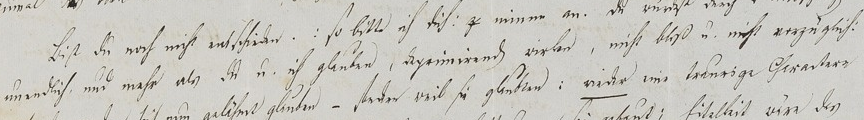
unendlich, und mehr als du und ich glauben: deprimirend wirken, nicht bloß u. nicht vorzüglich:
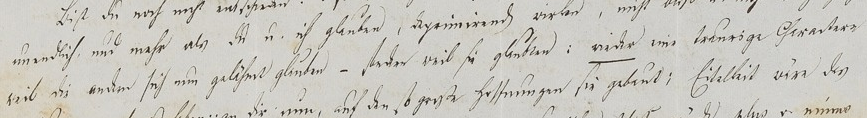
weil die andern sich nun gelähmt glauben – sondern weil sie glaubten: wieder eine traurige Character-
